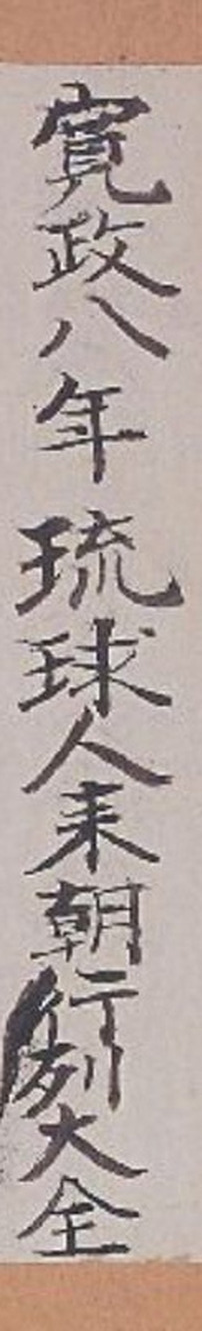寛政八年琉球人来朝行列大全

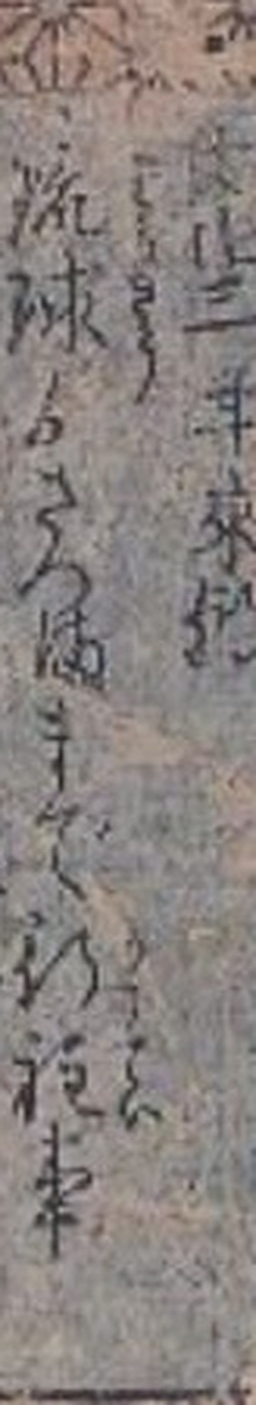琉球よりさつままで行程事
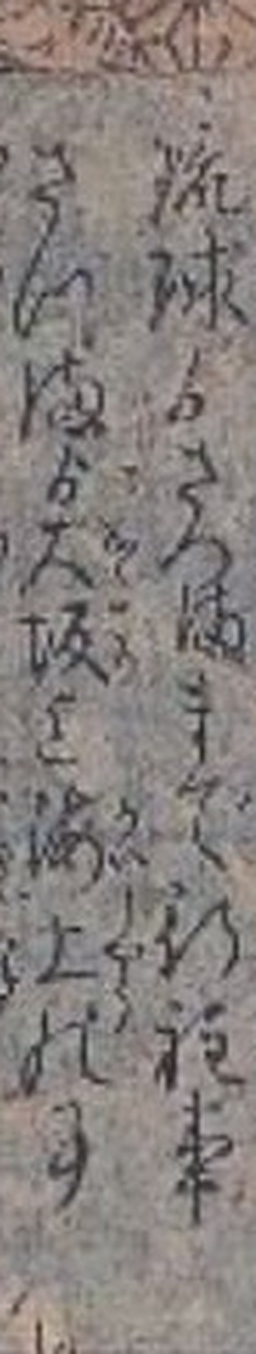さつまより大坂迄海上の事
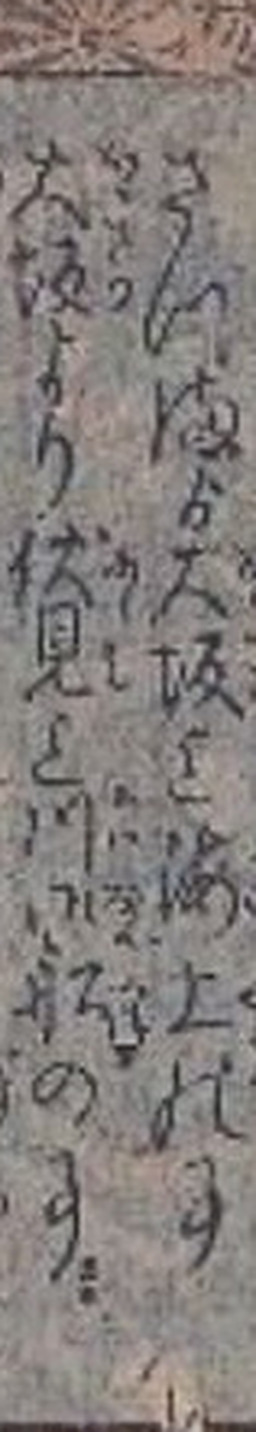大坂より伏見迄川御船の事
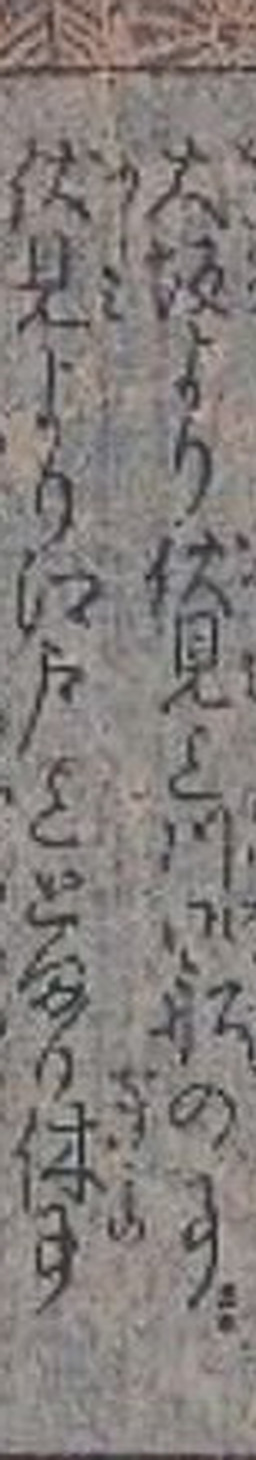伏見より江戸迄とまり休事
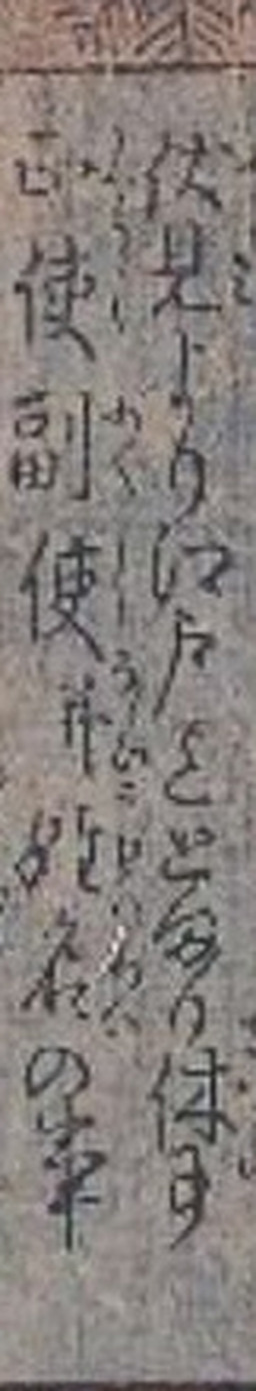正使副使并姓名の事
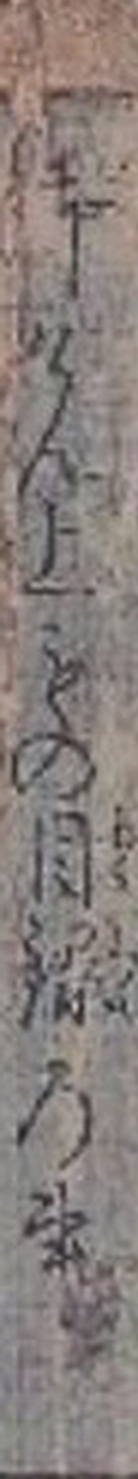御けん上もの目録の事
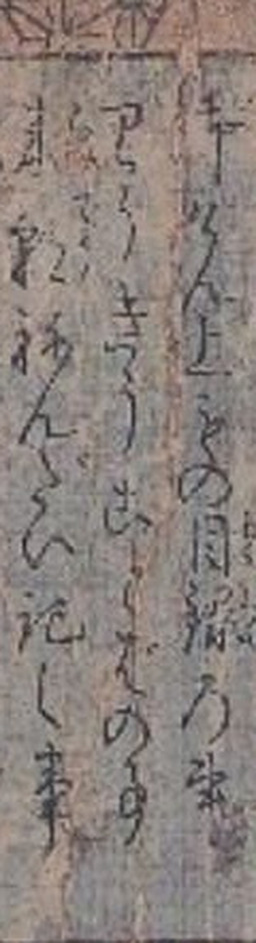りうきうことばの事
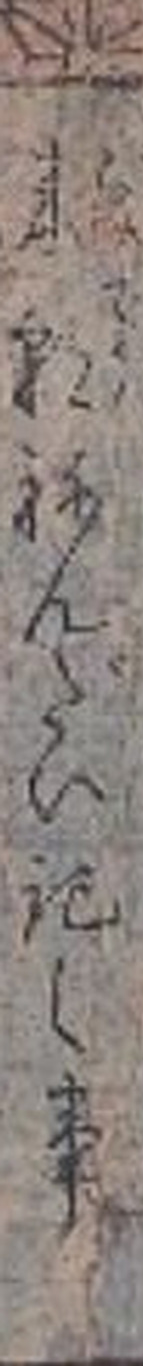来朝ねんだい記の事
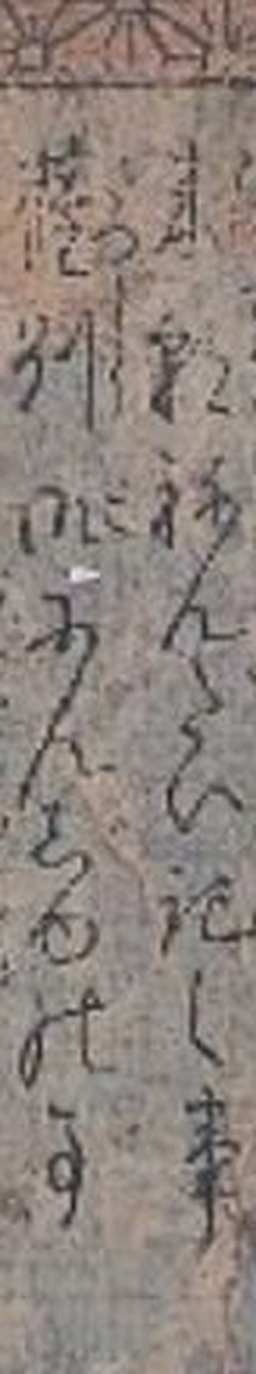薩州御にんじゆの事
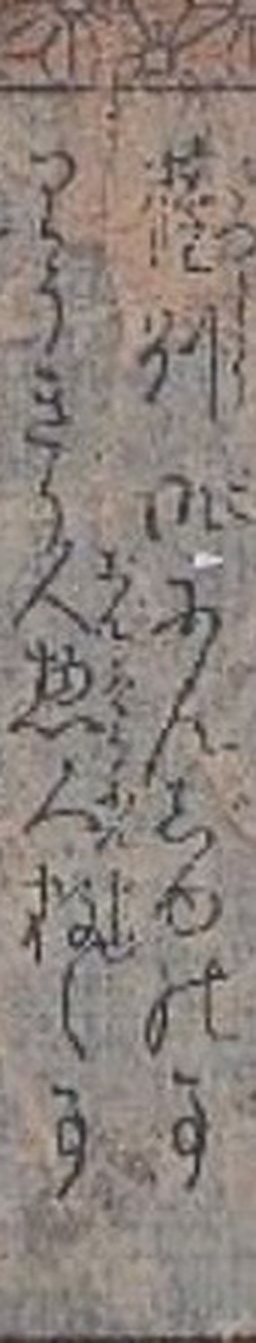りうきう人惣人数の事
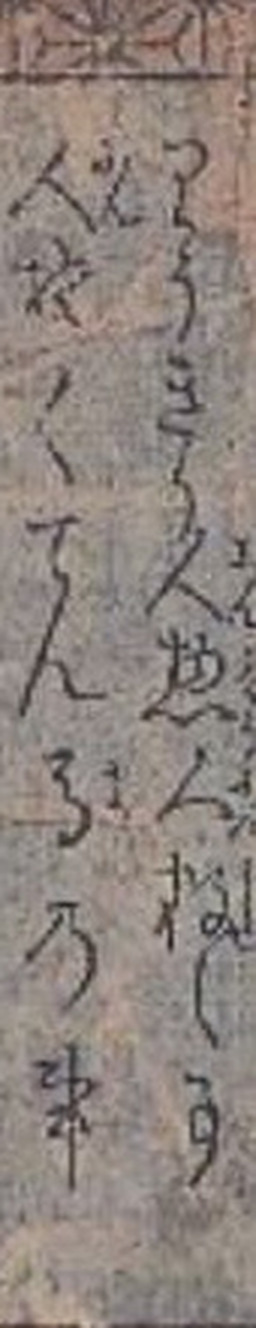人そくてん馬の事

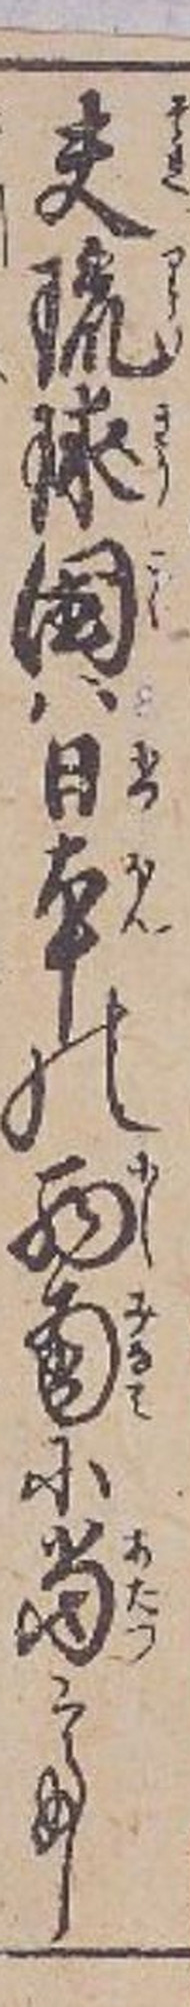夫琉球国は日本の西南に当て
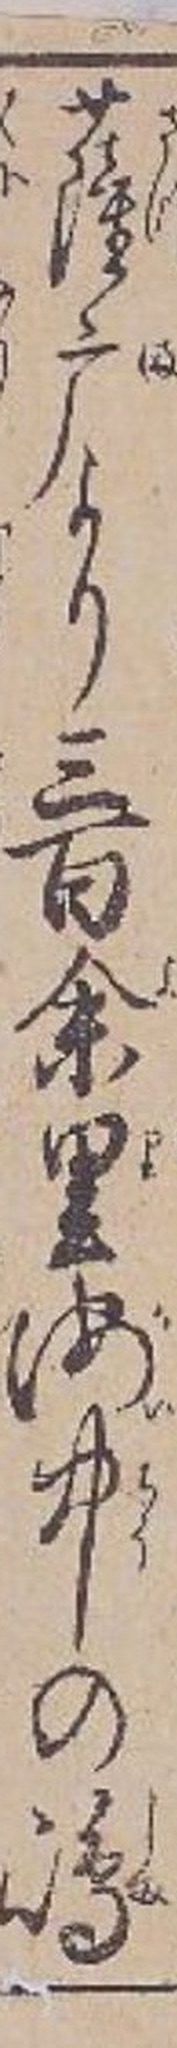薩摩より三百余里海中の嶋
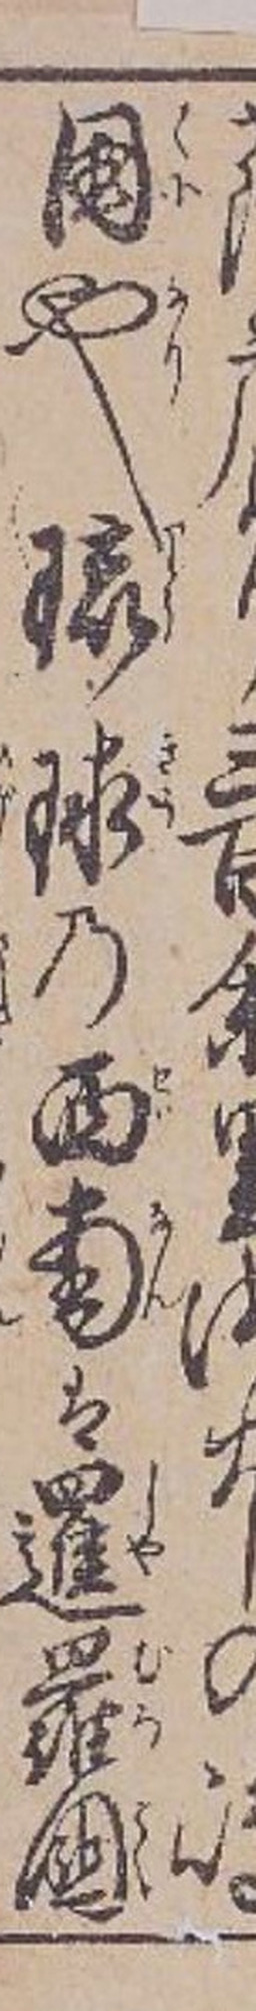国也琉球の西南は暹羅国
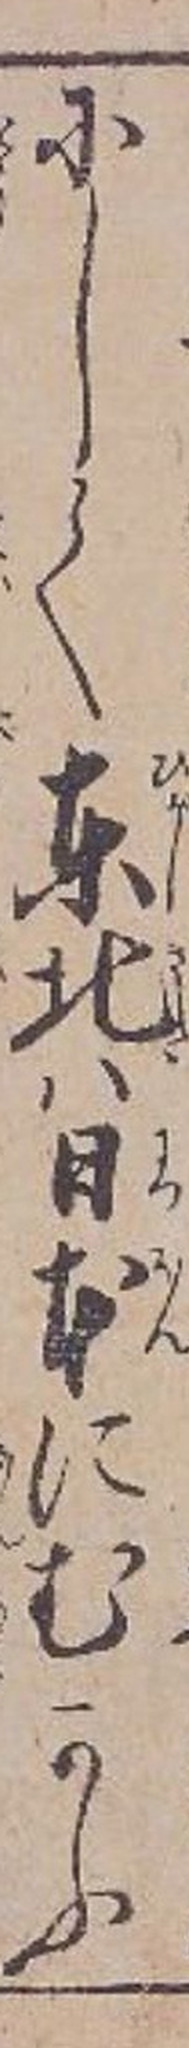にして東北は日本にむかふ
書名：琉球人大行列記 来朝新板絵入
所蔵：University of the Ryukyus Library
